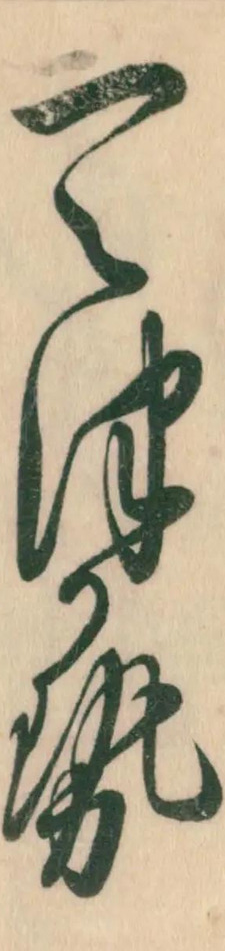天津かせ
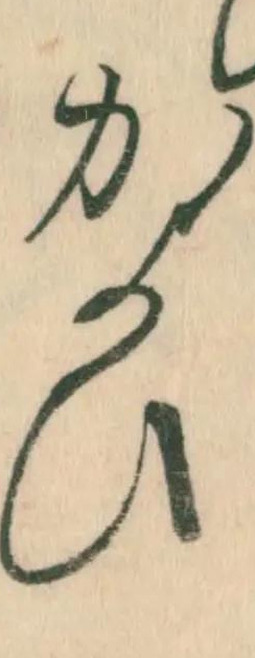かよひ
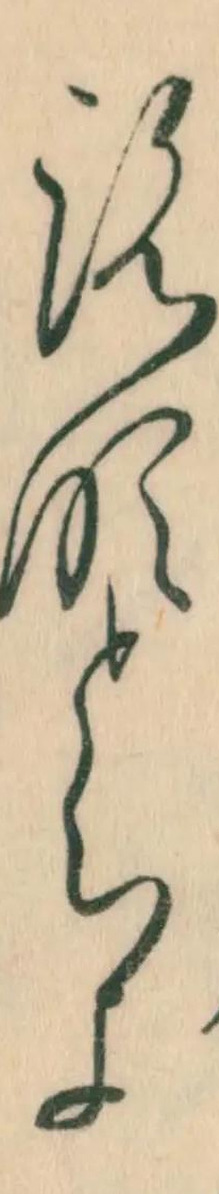路吹とちよ
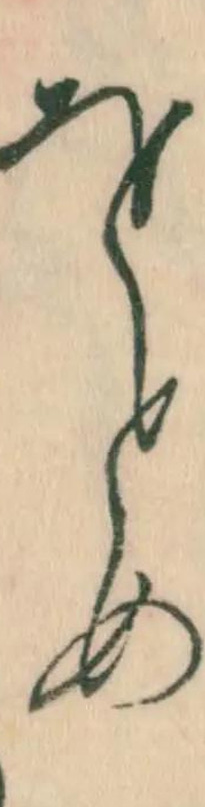をとめ
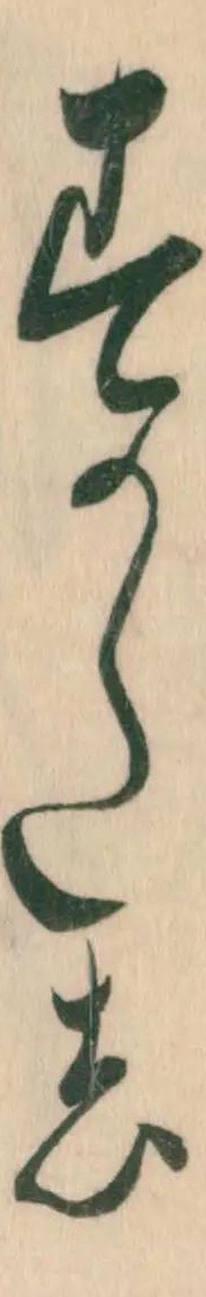すかたし
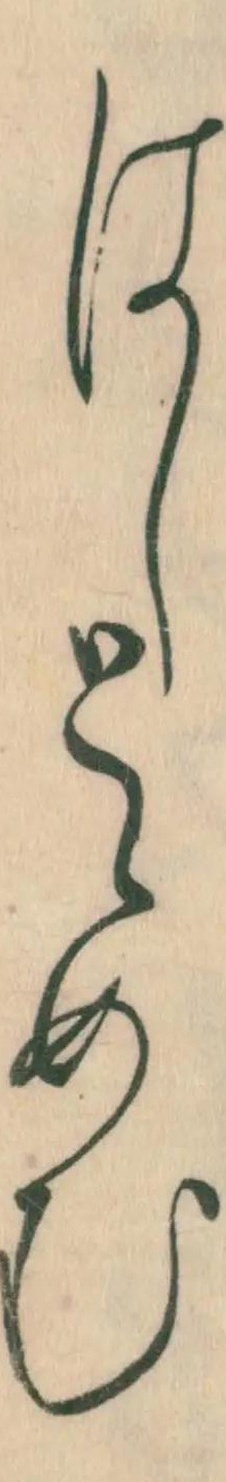はしとゝめむ
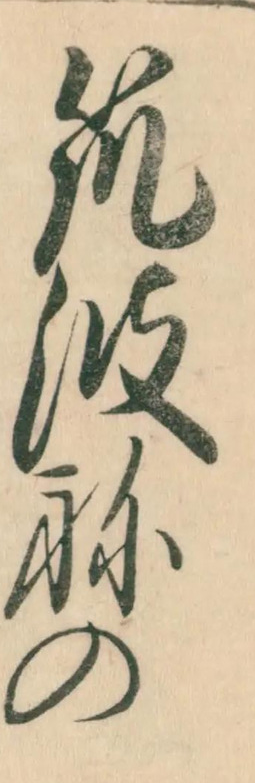筑波ねの
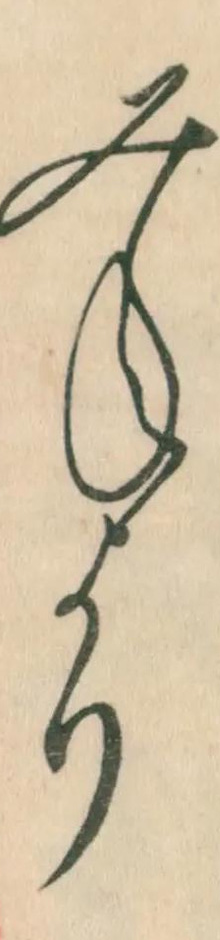みねより
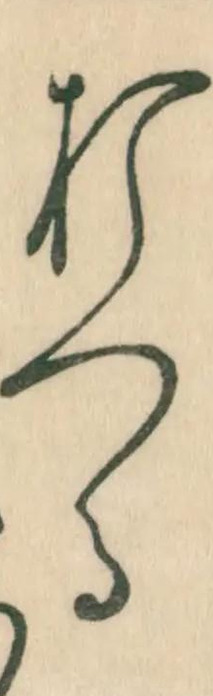おつる
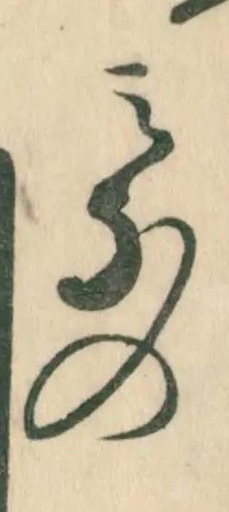みなの
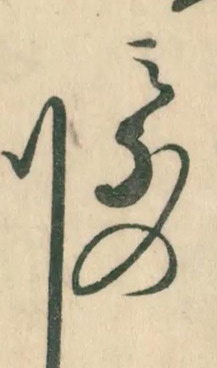みなの
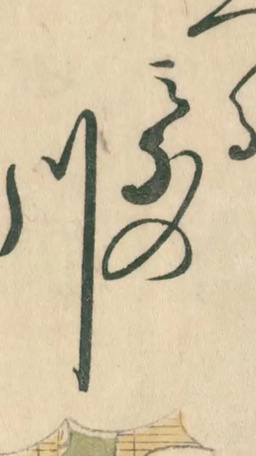みなの
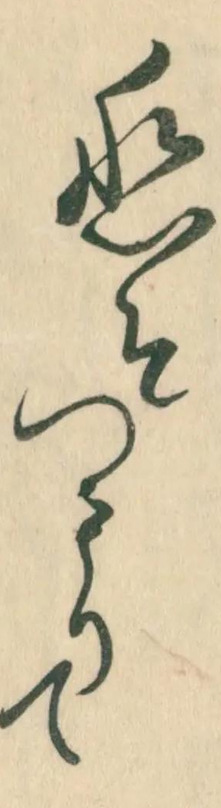恋そつもり

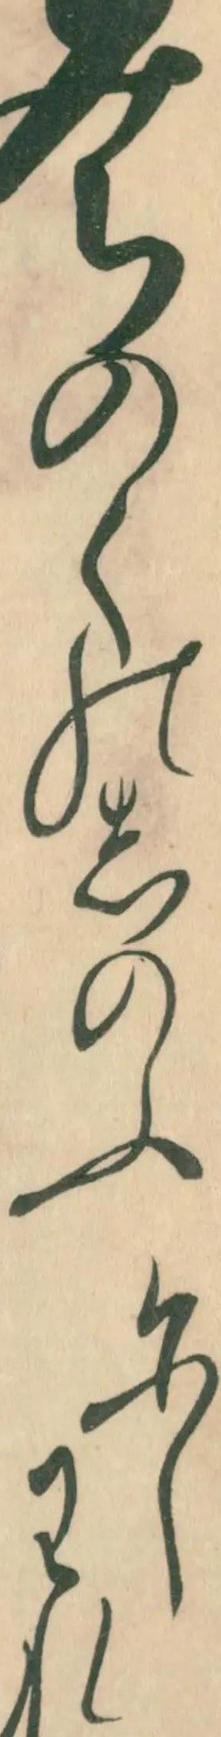みちのくのしのふにし
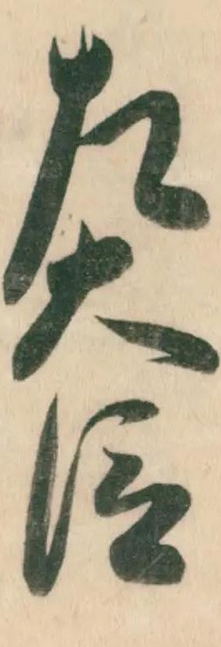左大臣
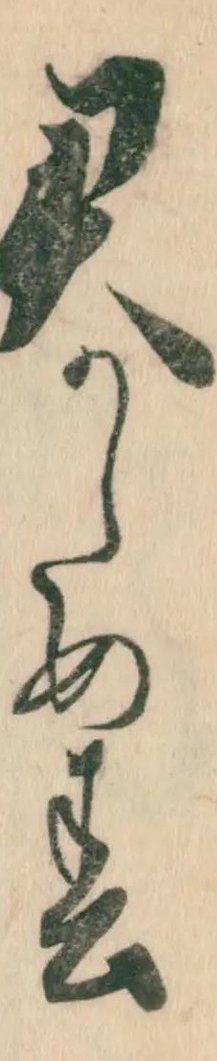君かため春
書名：錦百人一首あつま織
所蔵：国立国会図書館 National Diet Library, JAPAN
